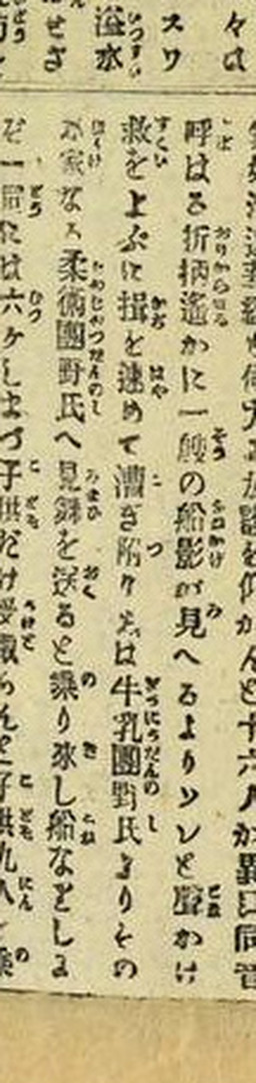救をよぶに楫を速めて漕ぎ附けしは牛乳團野氏よりその
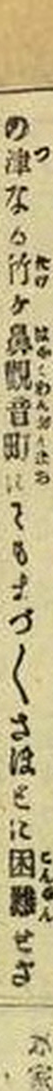の津なる竹ケ鼻観音町にてもまづ〳〵さほとに困難せざ
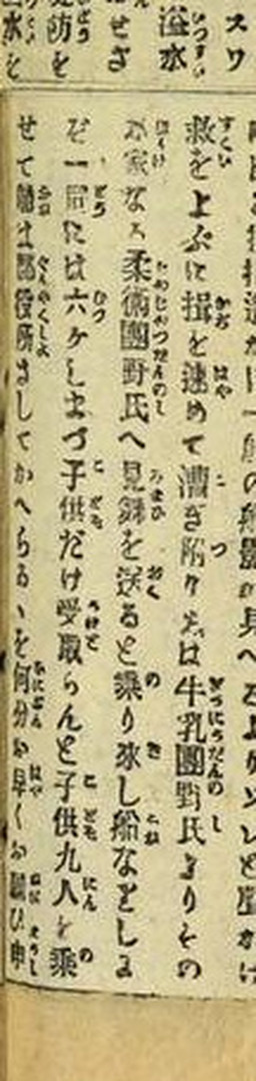本家なる柔術團野氏へ見舞を送ると乗り來し船なりしに
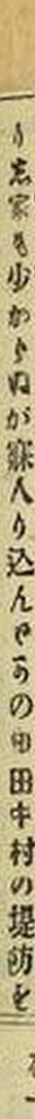りし家も少からぬが寐入り込んでかの和田中村の堤防を
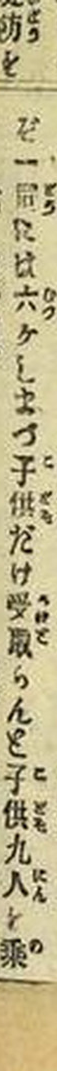ぞ一同には六ケしまづ子供だけ受取らんと子供九人を乘
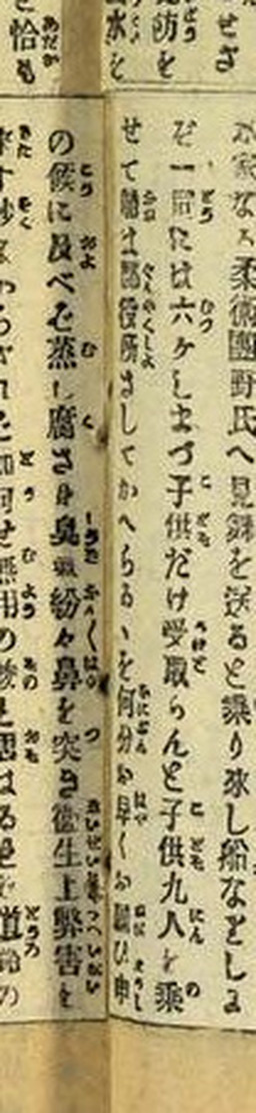せて船は郡役所さしてかへらるゝを何分お早くお願ひ申
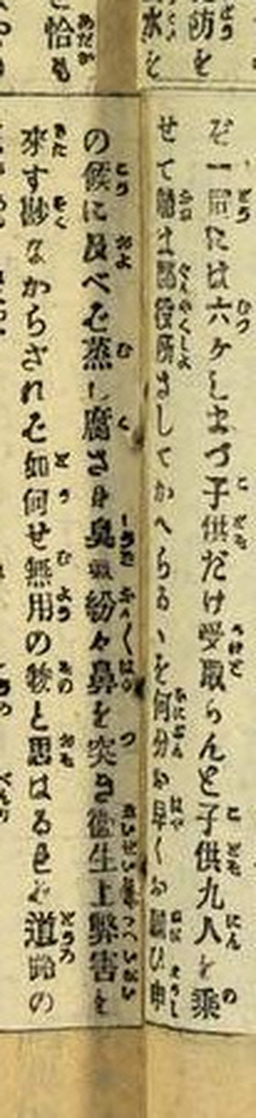の候に及べば蒸し腐され臭氣紛々鼻を突き衛生上弊害を
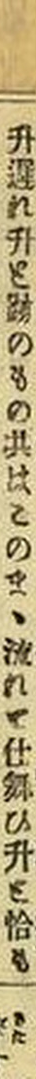升遅れ升と跡のもの共はこのまゝ流れて仕舞ひ升と恰も
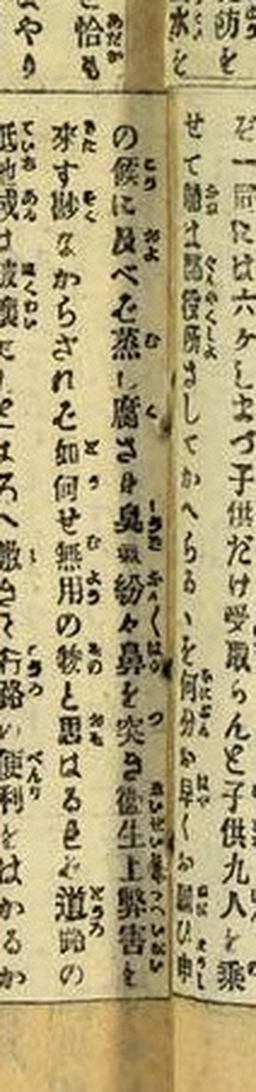の候に及べば蒸し腐され臭氣紛々鼻を突き衛生上弊害を
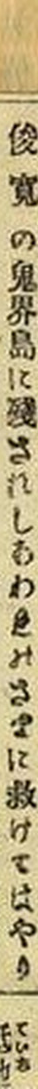俊寛の鬼界島に殘されしあわれのさまに救けてはやり
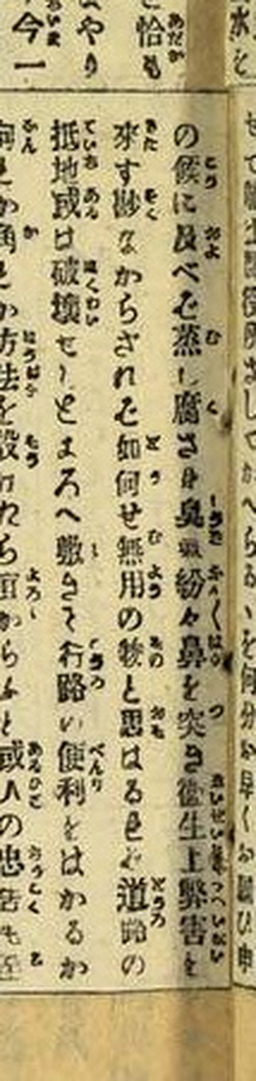來す尠なからざれば如何せ無用の物と思はるれば道路の
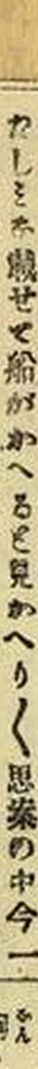たしみな載せて船がかへると見かへり〳〵思案の中今一
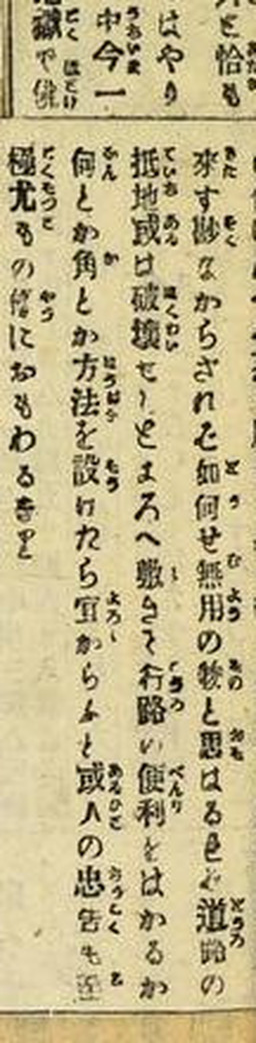抵地或は破壊せしところへ敷きて行路の便利をはかるか
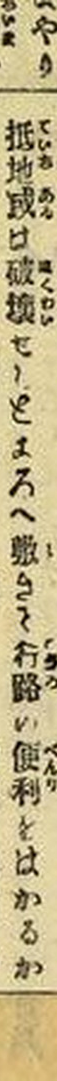抵地或は破壊せしところへ敷きて行路の便利をはかるか
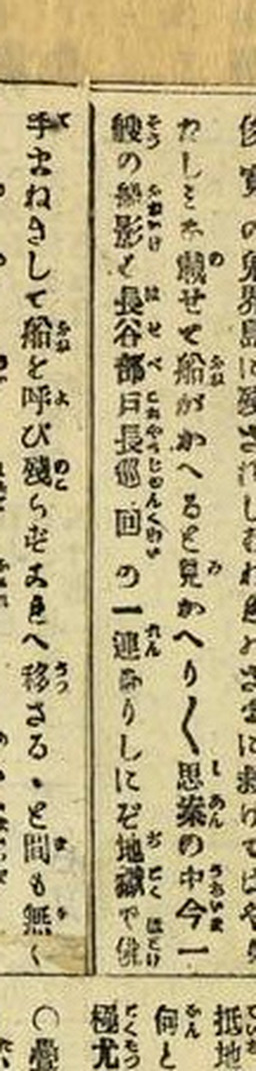艘の船影は長谷部戸長巡回の一連なりしにぞ地獄で佛
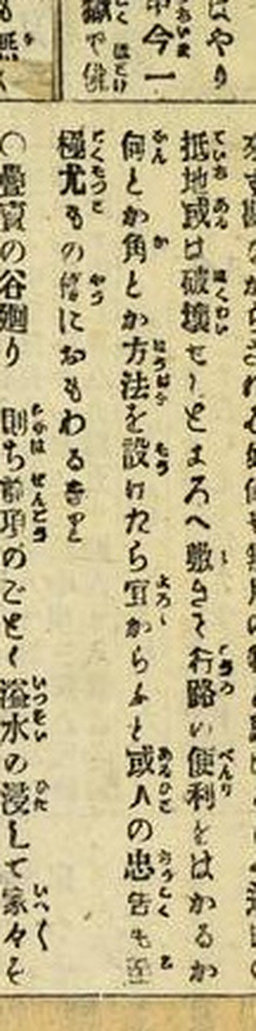何とか角とか方法を設けたら宜からふと或人の忠告も至
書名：温古集 五巻
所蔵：福井県文書館 Fukui Prefectural Archives
